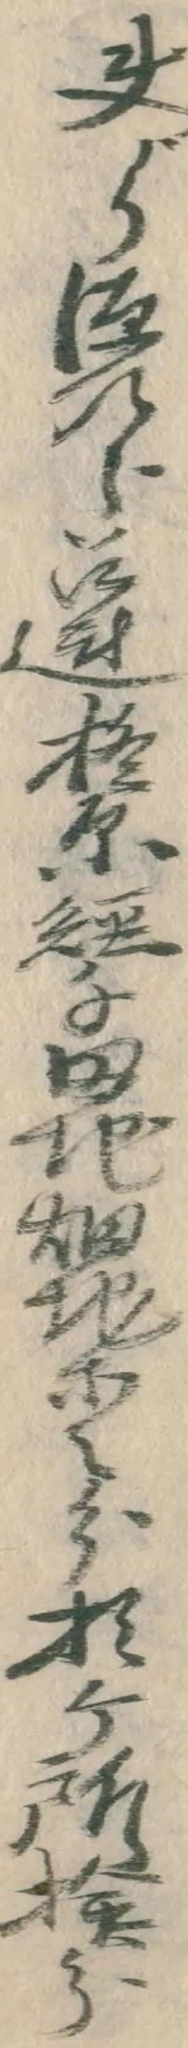夫より源次郎召連柊原経千田地畑地等之分拾ヶ所検分

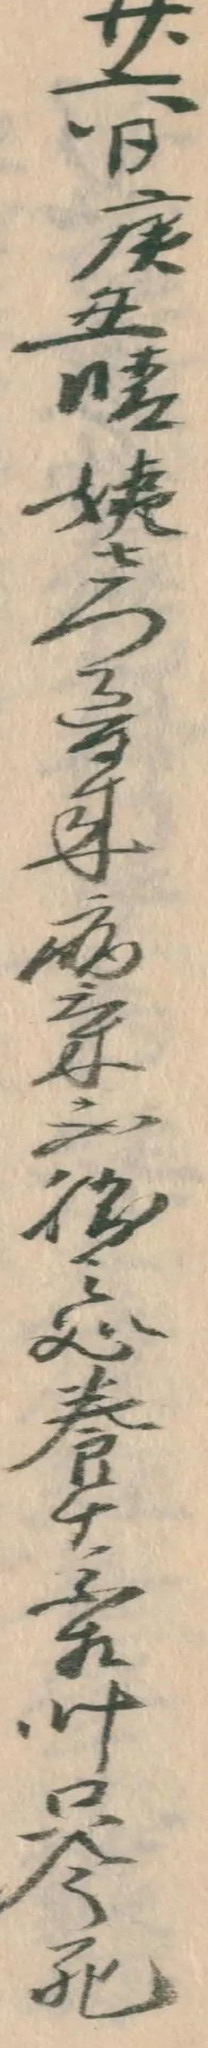廿六日庚丑晴姨さつ過日来病気不勝之処養生不相叶只今死
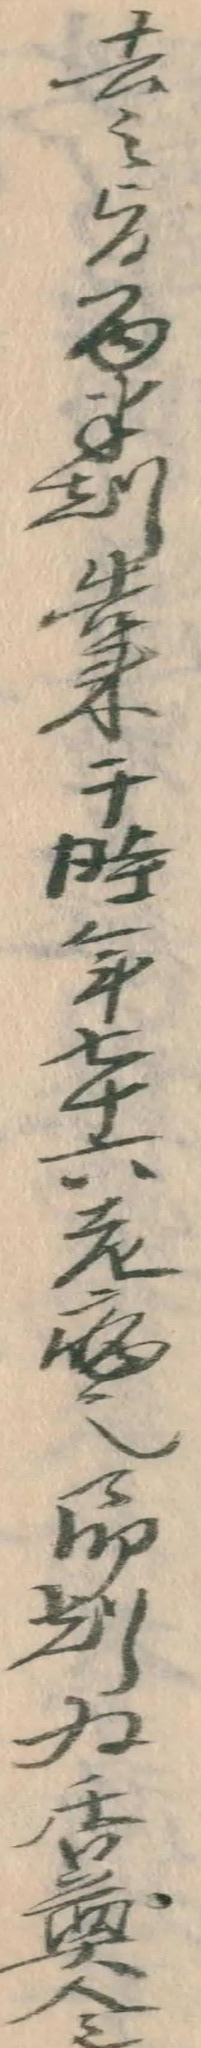去之旨酉半刻告来于時年七十六老病也即刻為香奠金
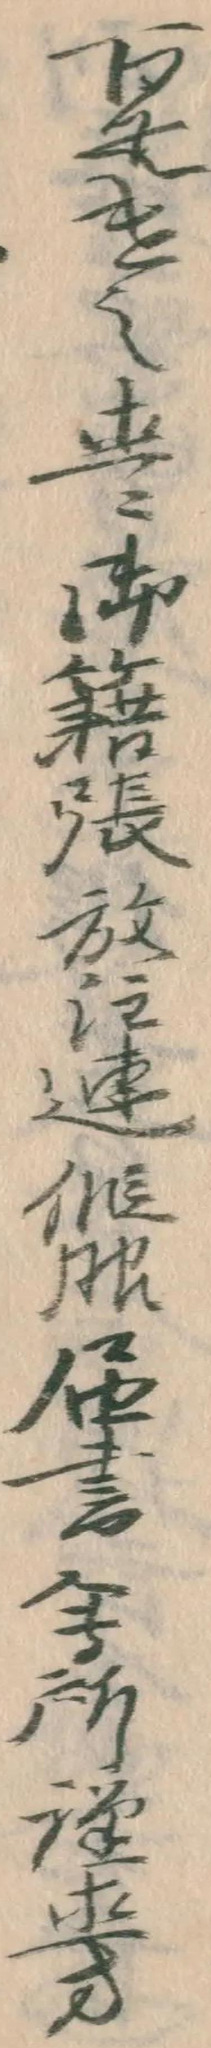百疋遣之直ニ御籍張放注連假服届書會所謹直方
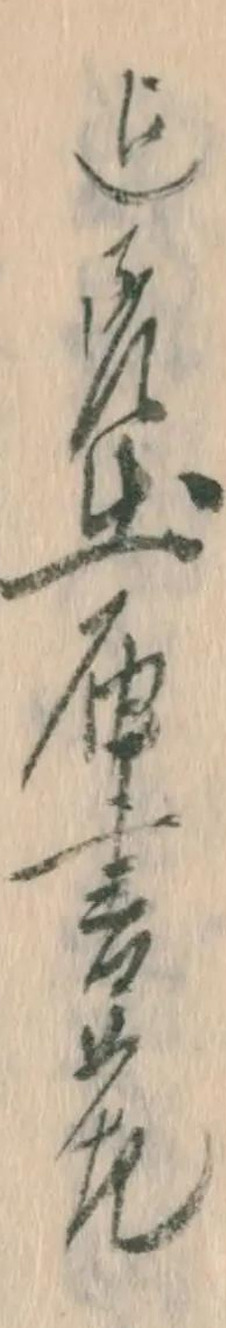迄差出届書如左
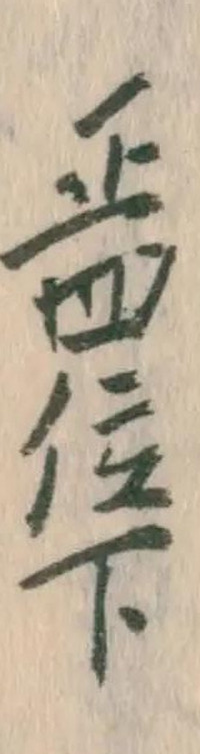正四位下
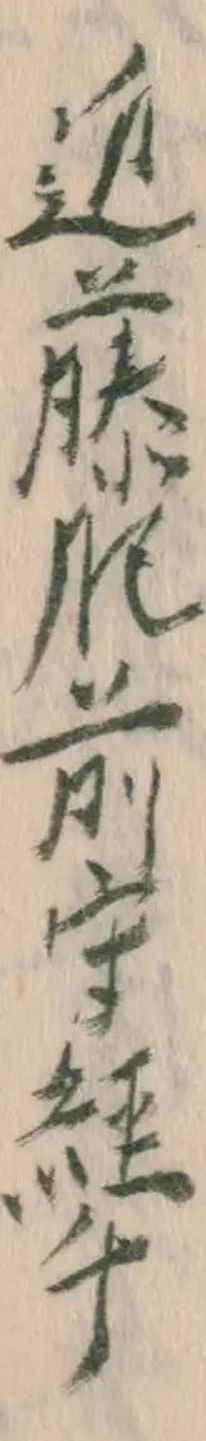近藤肥前守経千
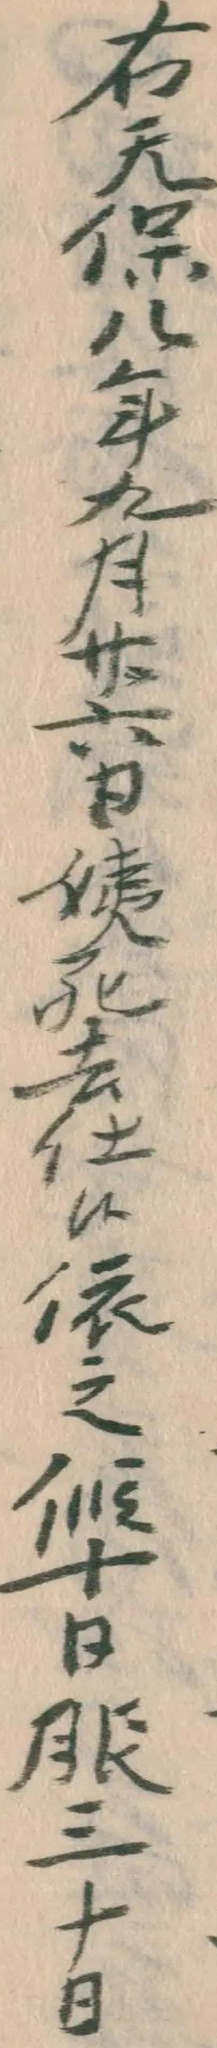右天保八年九月廿六日姨死去仕候依之假十日服三十日
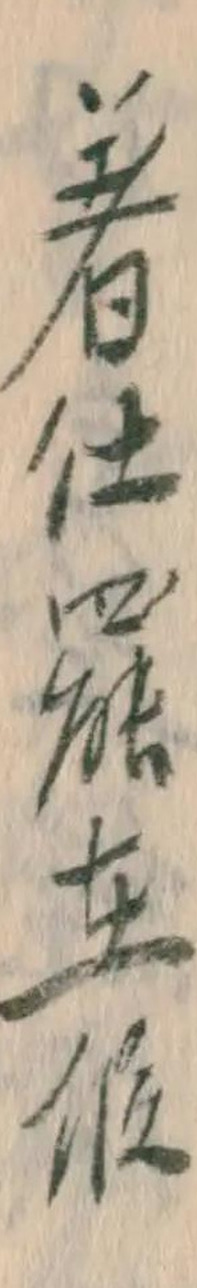着仕罷在候
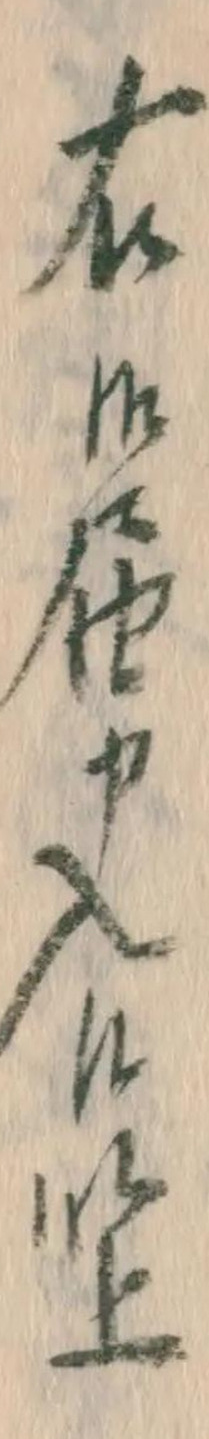右御届申入候以上
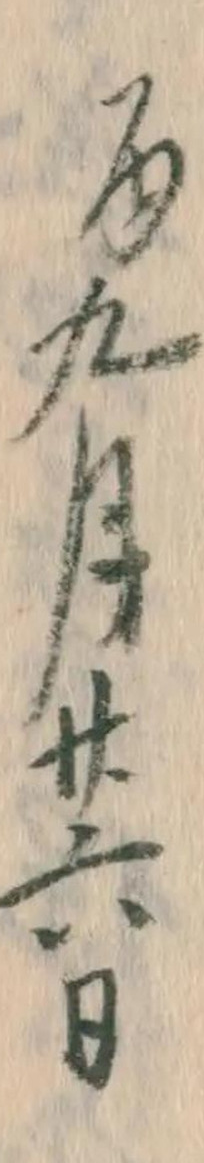酉九月廿六日
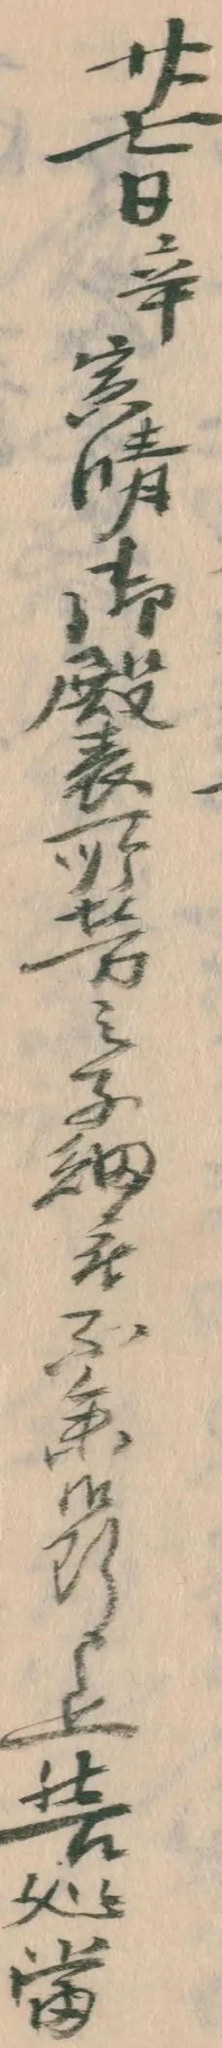廿七日辛寅晴御殿表所労之子細ニ付不参御断申上仕候処當
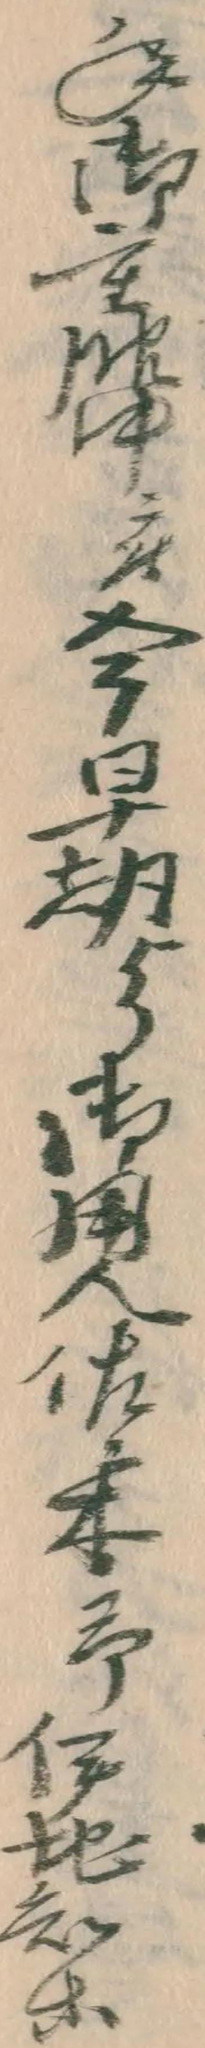年御重服中ニ付今日朝より御用人佐々木予伊地知等
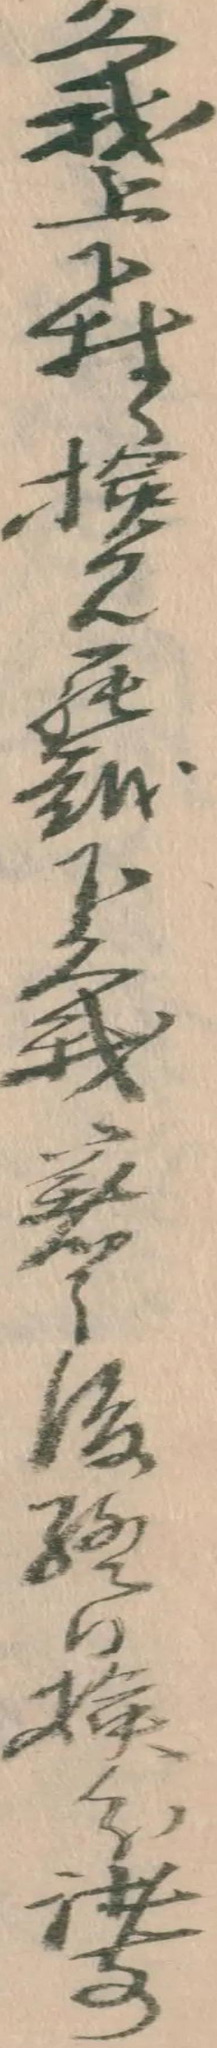久我上下村へ検見罷越下久我ヘ着之後終日検分諸事
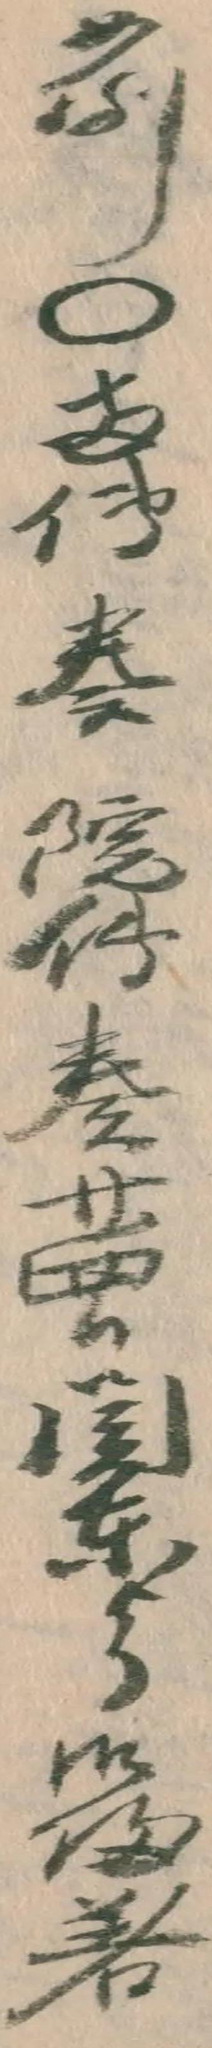如例○両傳奏院伝奏廿四日関東より御帰着
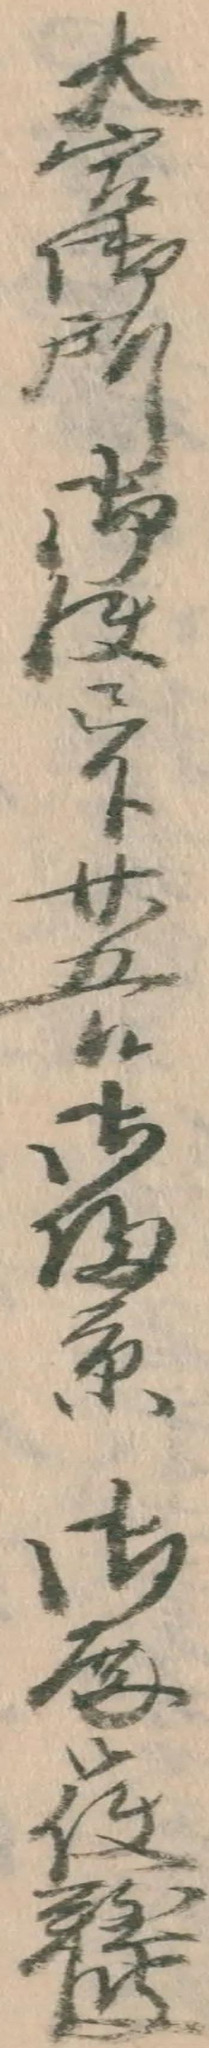大宮御所御使已下廿五日御帰京御殿御使難波
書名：賀茂社記録. 第67冊
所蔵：国立国会図書館 National Diet Library, JAPAN
